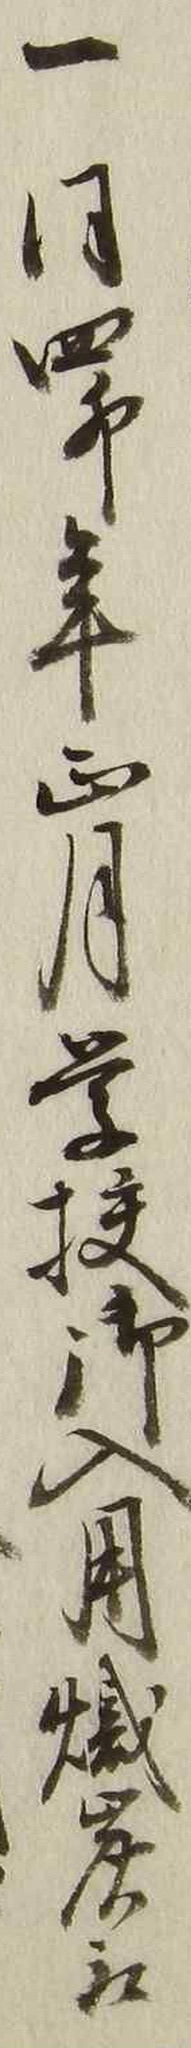一同四卯年正月学校御入用熾炭取
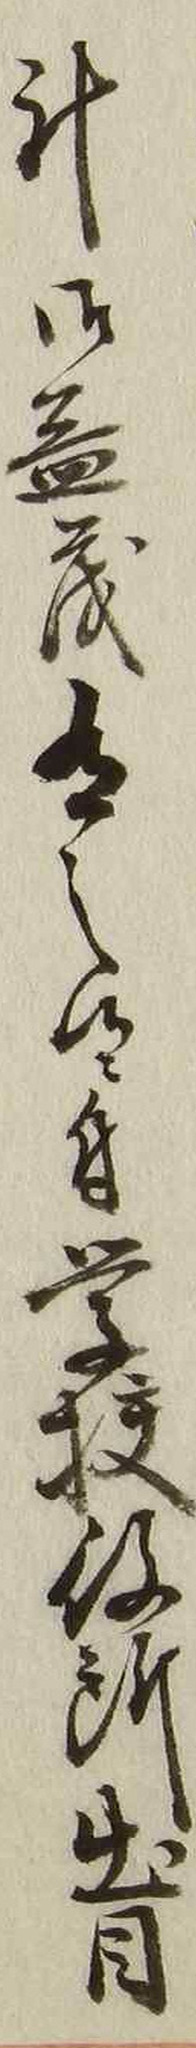計御益茂有之候ニ付学校役所出目
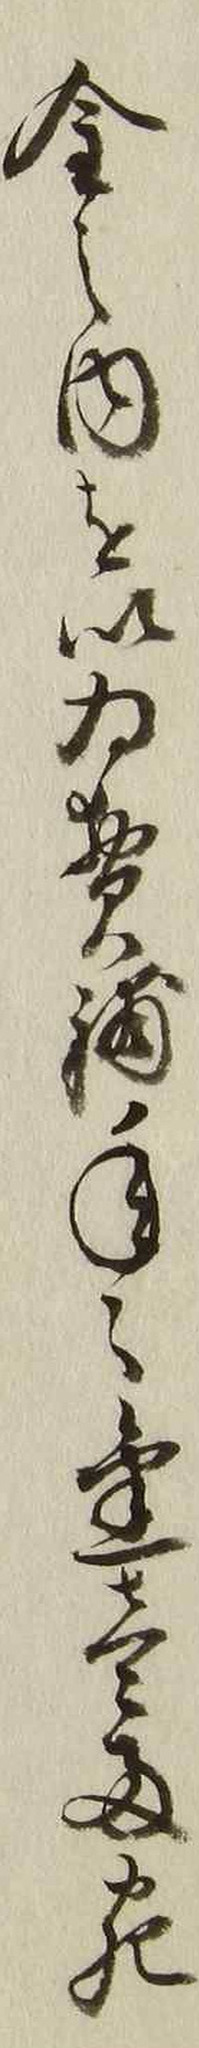金之内を以為費補年々金壱両宛
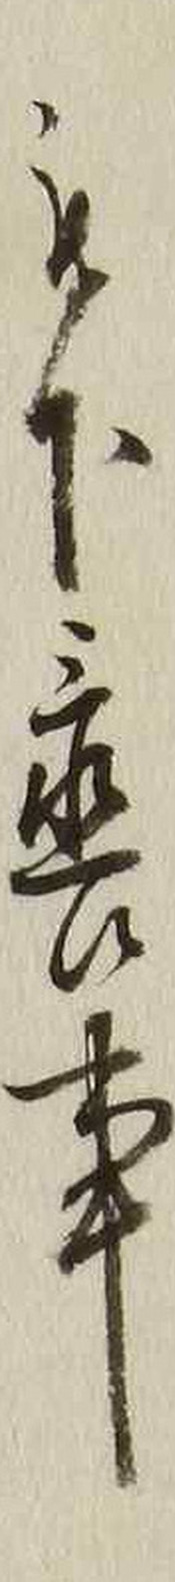被下置候事
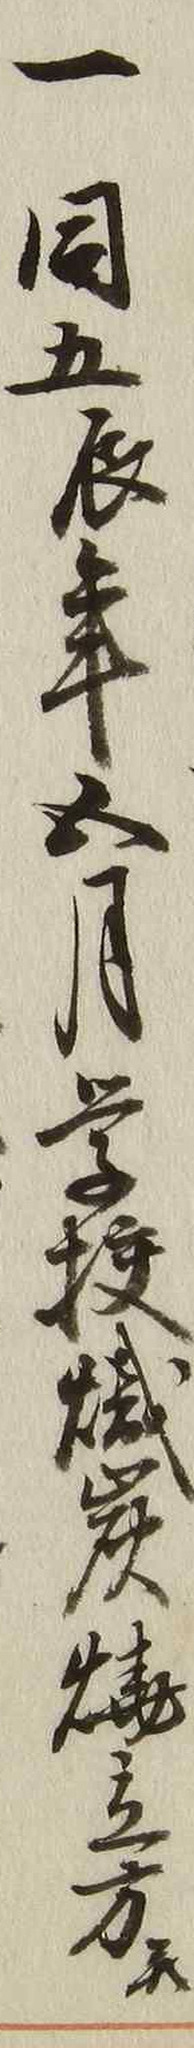一同五辰年五月学校熾炭焼立方并
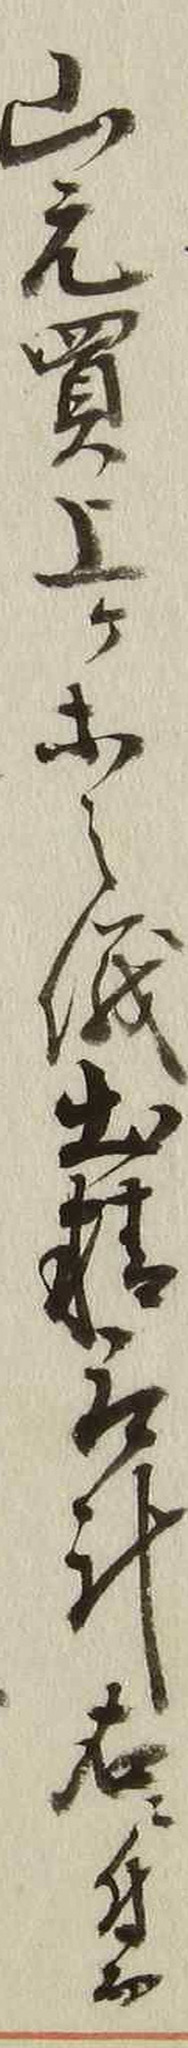山元買上ケ等之儀出精取計右ニ付而
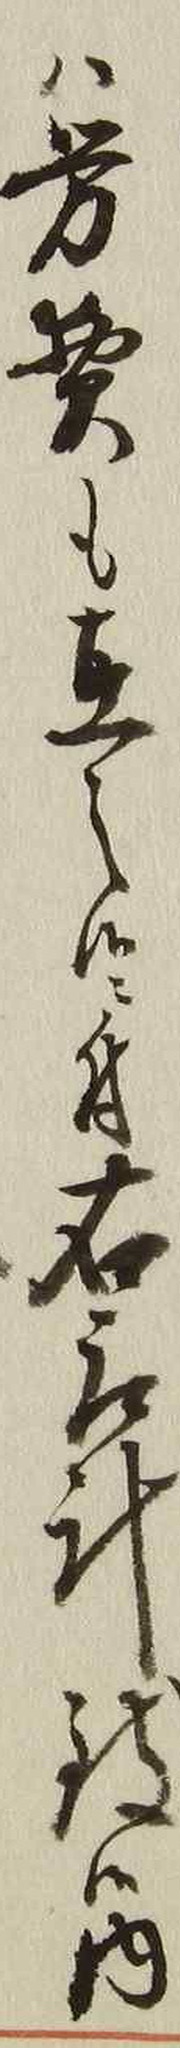ハ労費も在之候ニ付右取計致候内
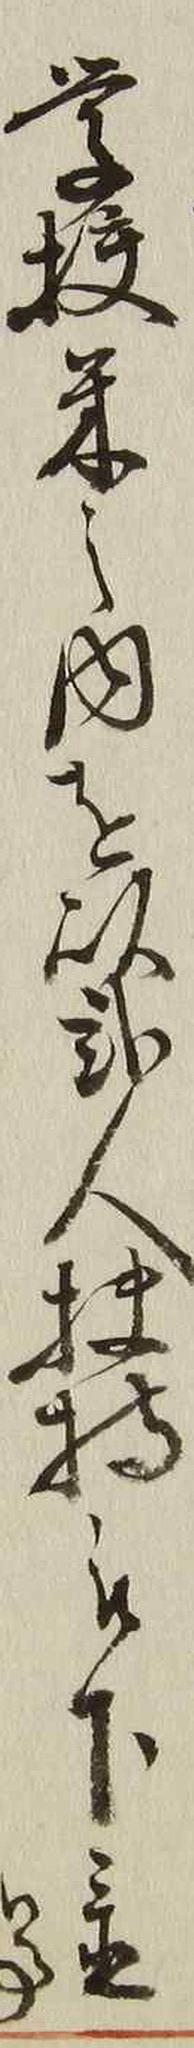学校米之内を以弐人扶持被下置候事
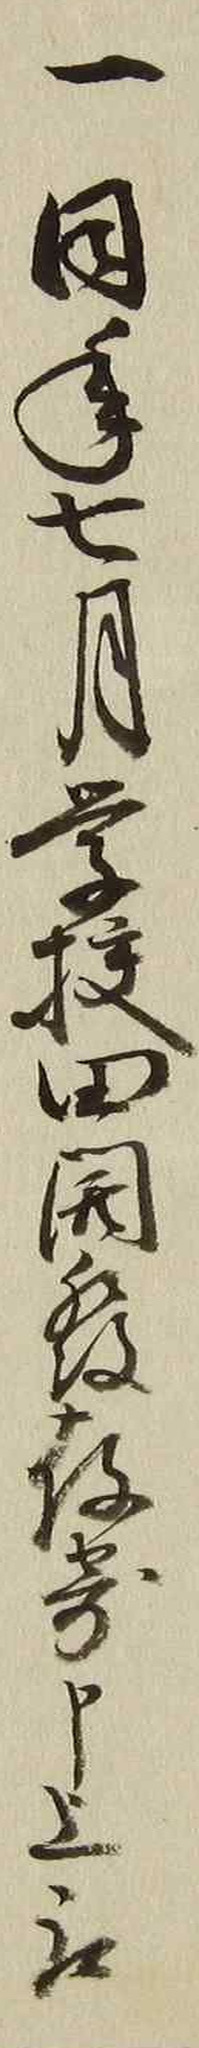一同年七月学校田開発存寄申上取
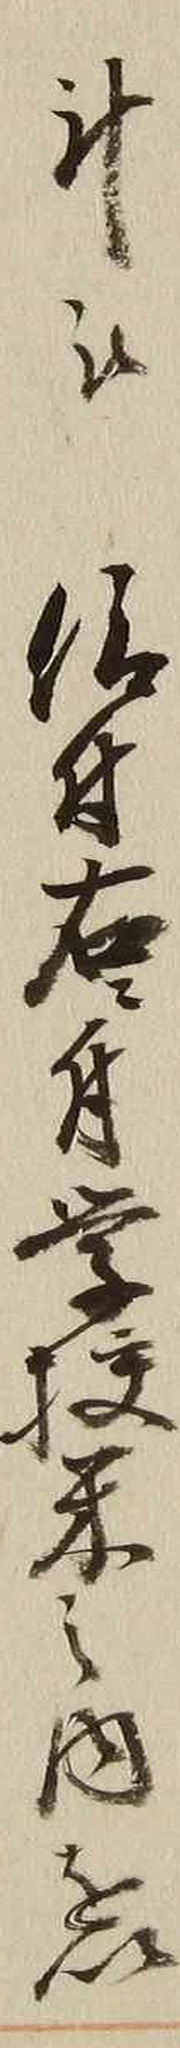計被仰付右ニ付学校米之内を以
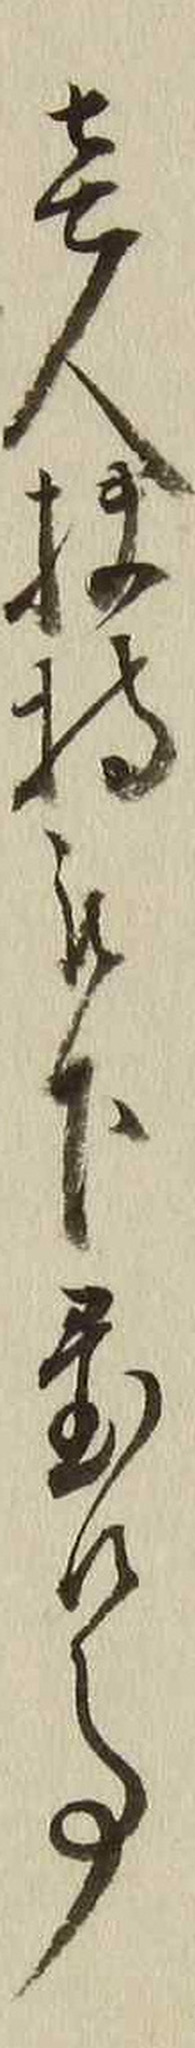壱人扶持被下置候事
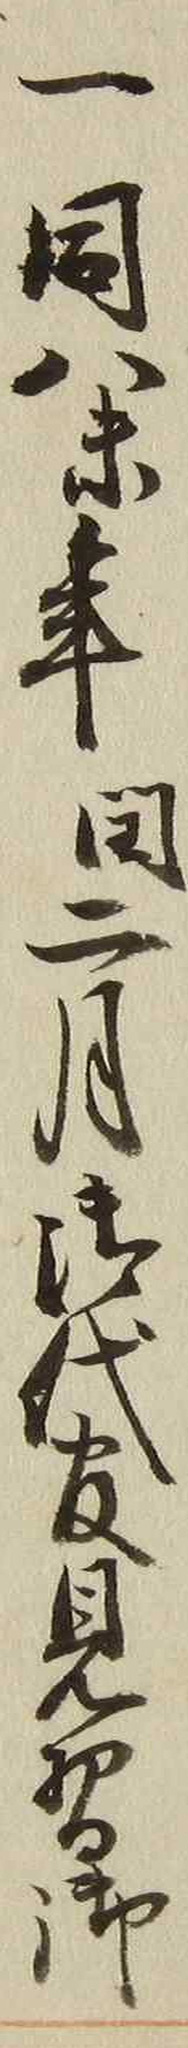一同八未年閏二月御代官見習御
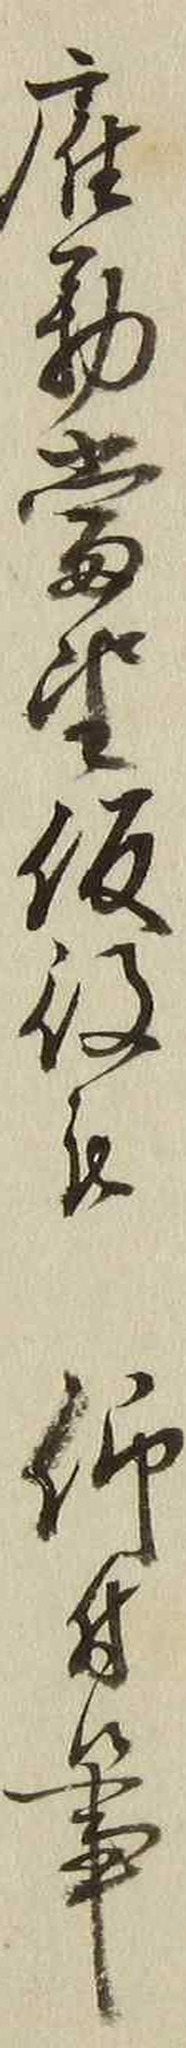雇勤当座仮役被仰付候事
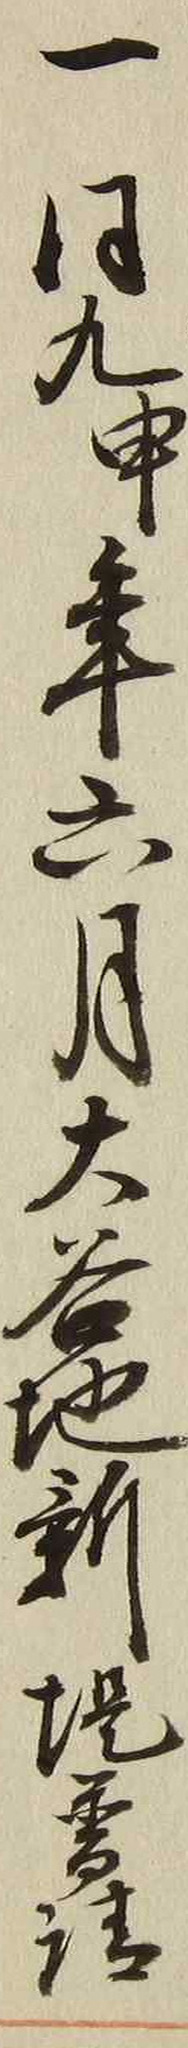一同九申年六月大谷地新堤普請
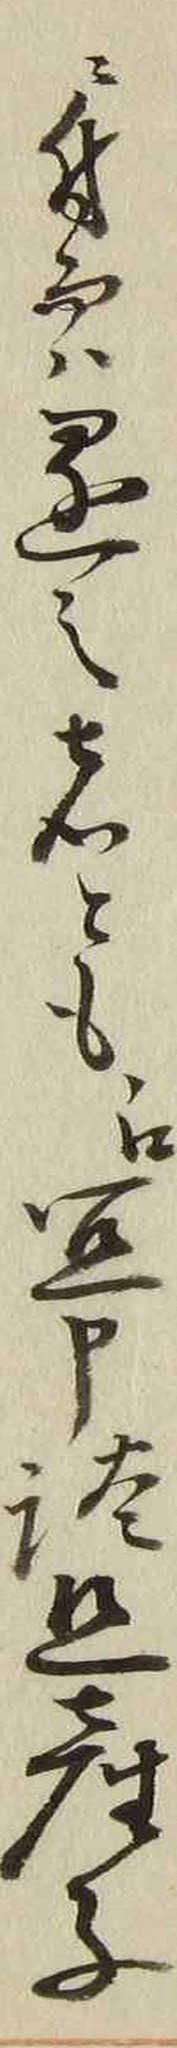ニ付而ハ懸之者とも江宜申談且産子
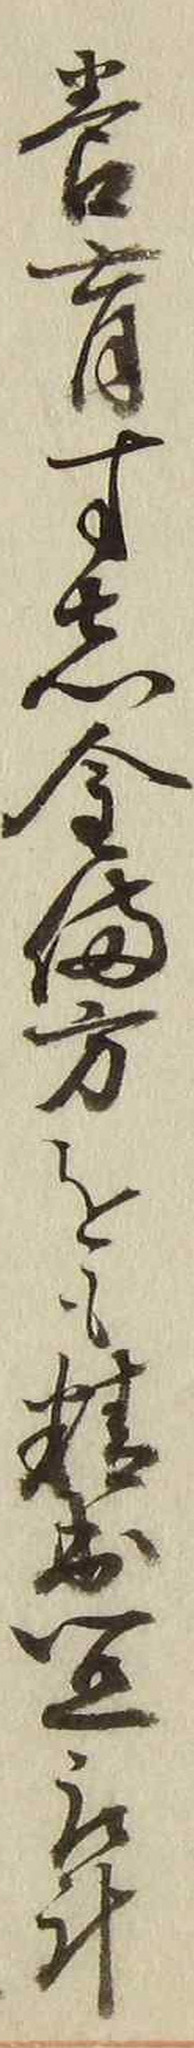養育寸志金備方をも精出宜取計
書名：諸士系譜　巻之27　い之部27
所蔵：会津若松市立会津図書館
